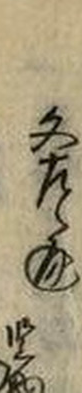文左之通
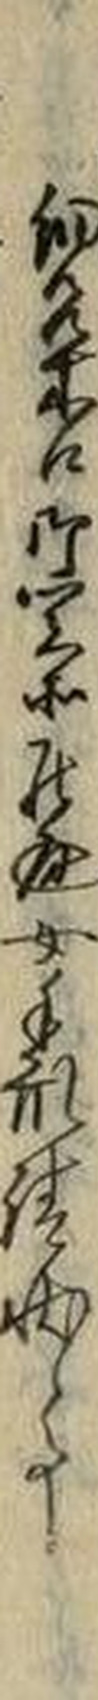細呂木口御関所罷通女手形請状之事
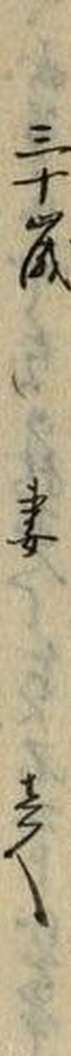三十歳妻壱人
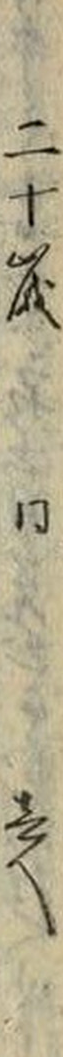二十歳同壱人
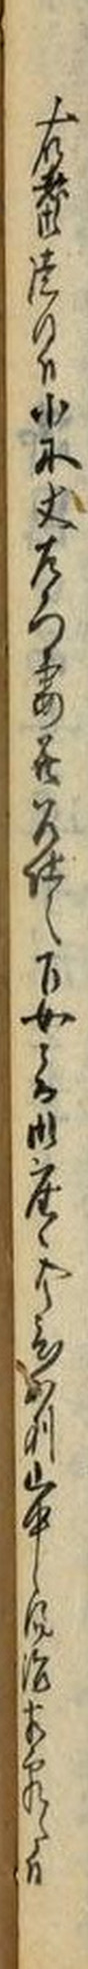右者御徒目付小木文左衛門妻幷召仕之下女ニ而御座候今度加州山中へ湯治相願候ニ付
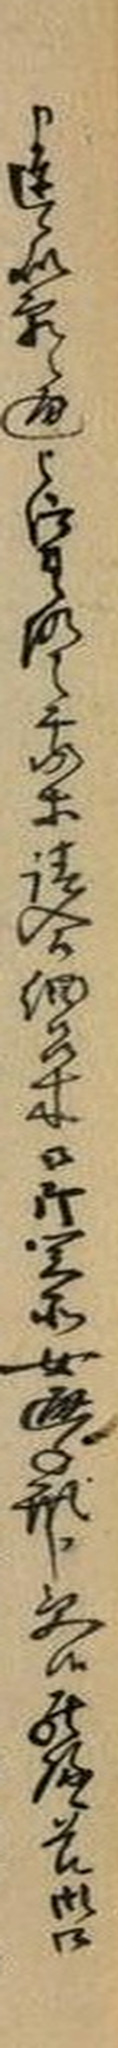申達候処願之通被仰付候仍之我等請合細呂木口御関所女通手形申受候罷帰候節御口
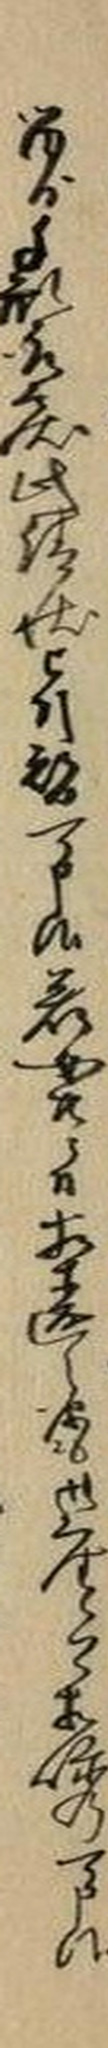留ゟ手形取戻此請状被引替可申候若女共ニ付相違之儀も御座候ハヽ相唀可申候
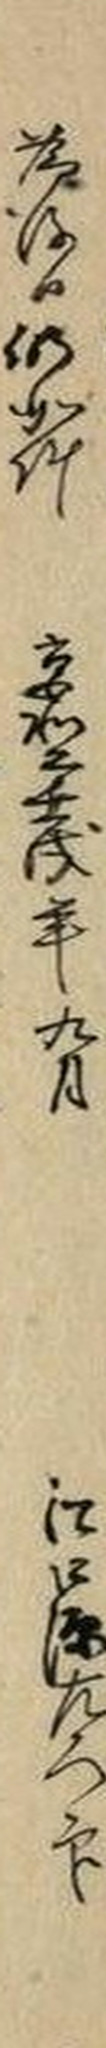為後日仍如件享和二壬戌年九月江口源左衛門印
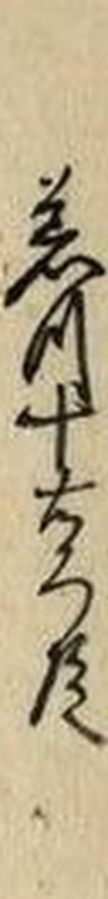荒川十右衛門殿
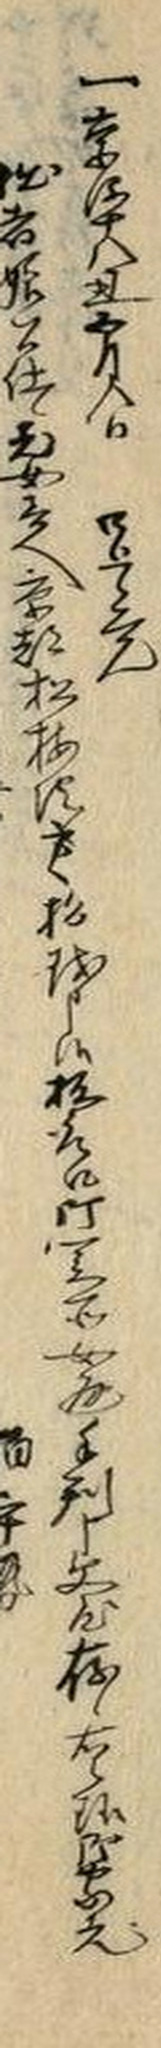拙者姫召仕候老女壱人京都松梅院方へ指越申候板取口御関所女通手判申受度存候右之趣御家老
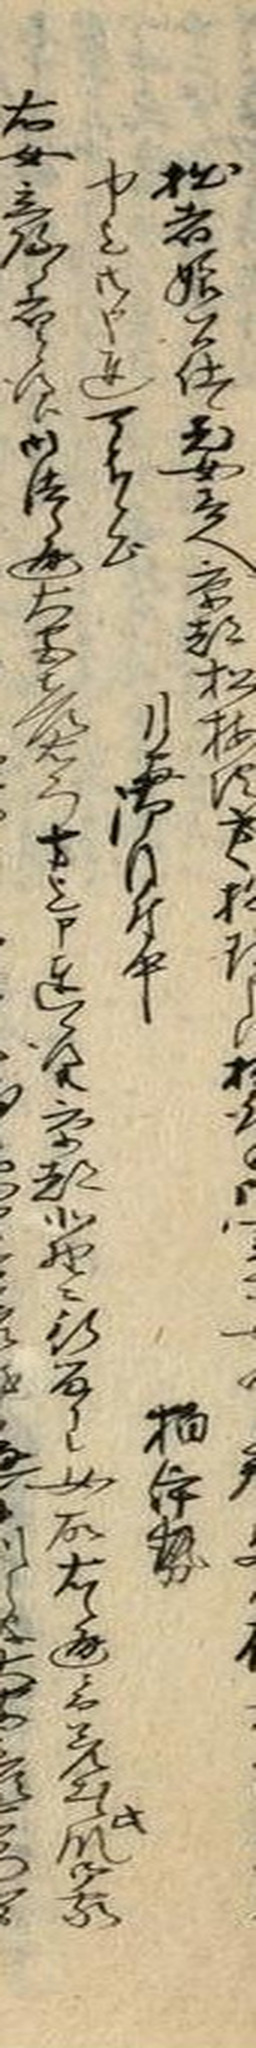右女立帰候者ニ候得ハ御法之通大宮彦右衛門方迄申達候得共京都北野ニ行留り之女故右之通ニ而差出候此段御家
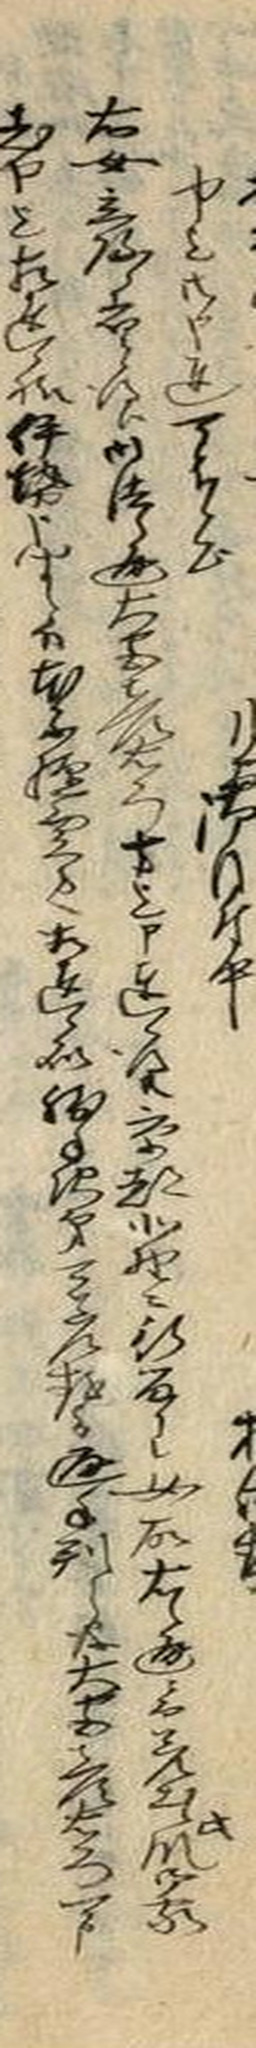老中迄相達候様伊勢申聞候ニ付本多縫殿方へ相達候処勝手次第可差越旨通手判之儀大宮彦右衛門可申
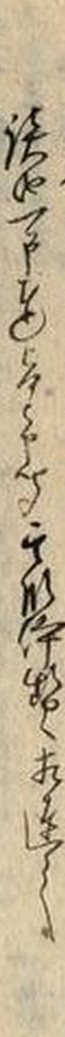談由可申達旨被申聞其段伊勢へ相達之
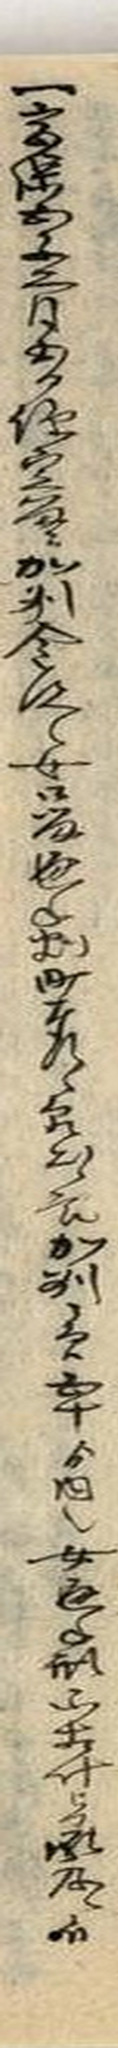一享保五子二月五日評定留ニ加州金沢之女口留通手形町奉行へ願出候節加州ニ而ハ五十ゟ内之女通手形不相叶旨承及候ニ付
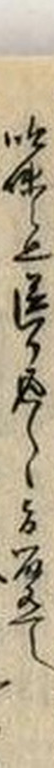吟味之上送り返し候旨留有之
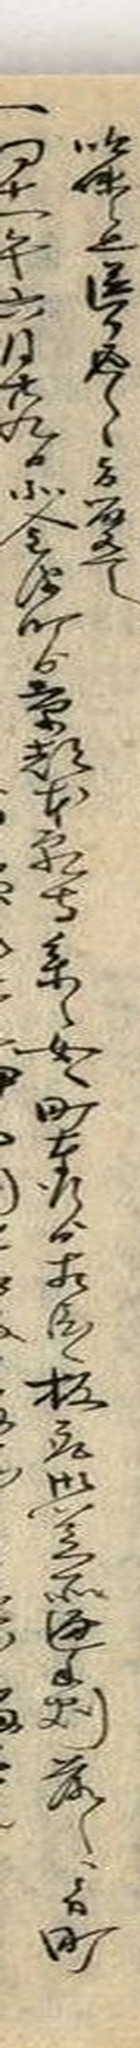一同十一午六月廿九日北金津町ゟ京都本願寺参候女へ町奉行ゟ相渡候板取御関所通手判落し候ニ付町
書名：御国他国諸事之部
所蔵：福井県文書館 Fukui Prefectural Archives
